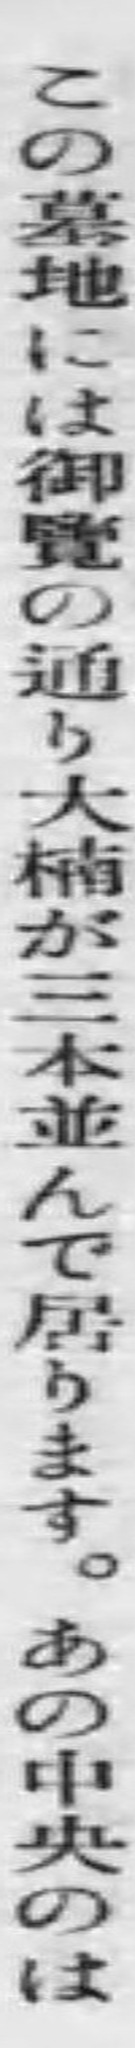この墓地には御覧の通り大楠が三本並んで居ります。あの中央のは
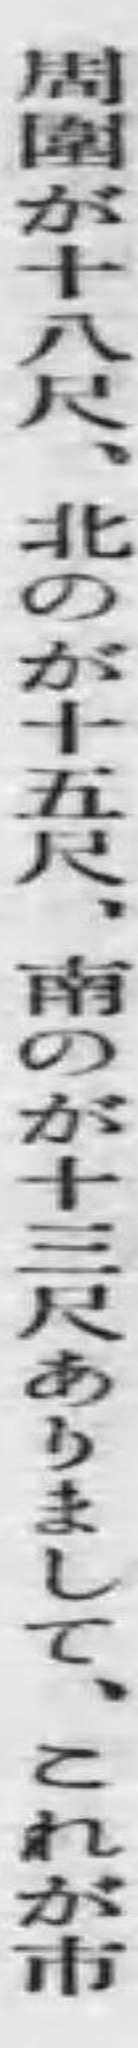周囲が十八尺、北のが十五尺、南のが十三尺ありまして、これが市
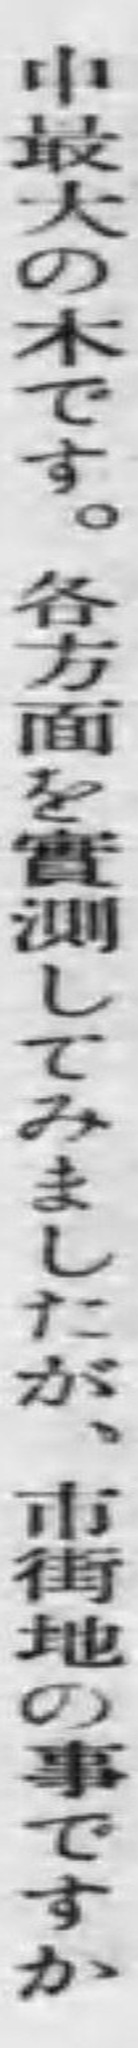中最大の木です。各方面を実測してみましたが、市街地の事ですか
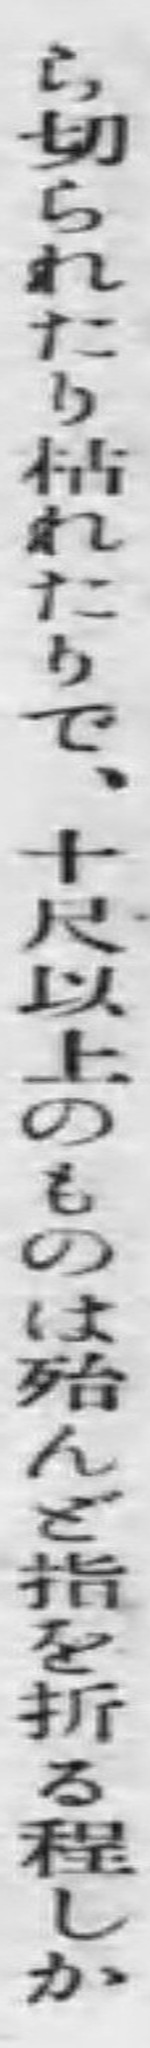ら切られたり枯れたりで、十尺以上のものは殆んど指を折る程しか
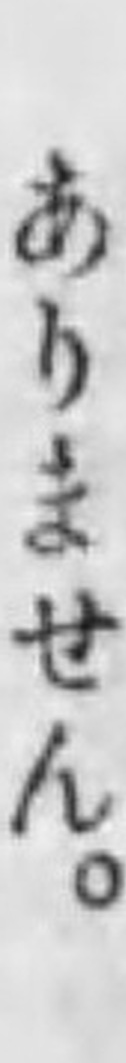ありません。
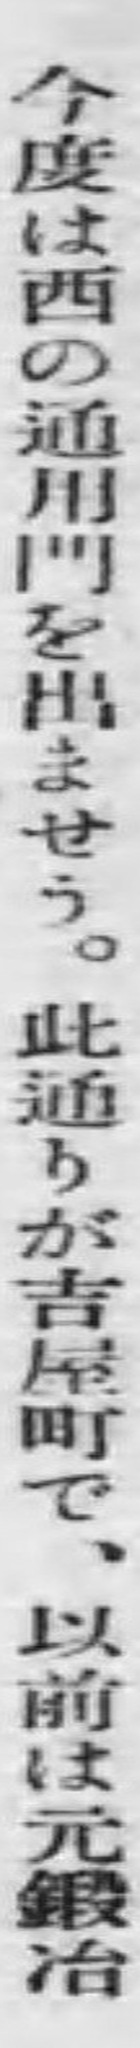今度は西の通用門を出ませう。此通りが吉屋町で、以前は元鍛冶
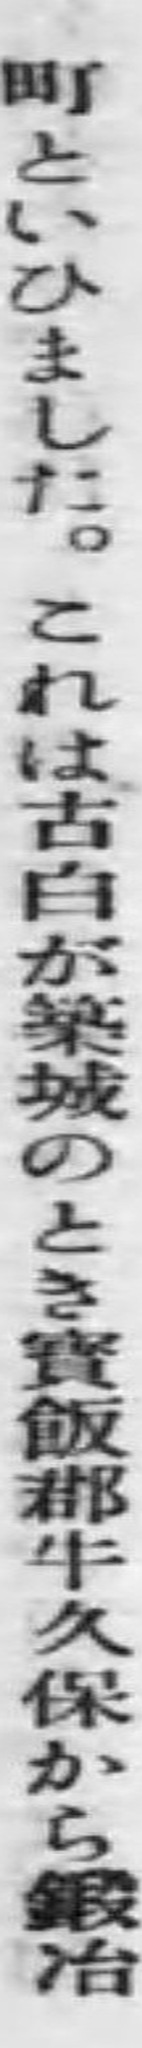町といひました。これは古白が築城のとき宝飯郡牛久保から鍛冶
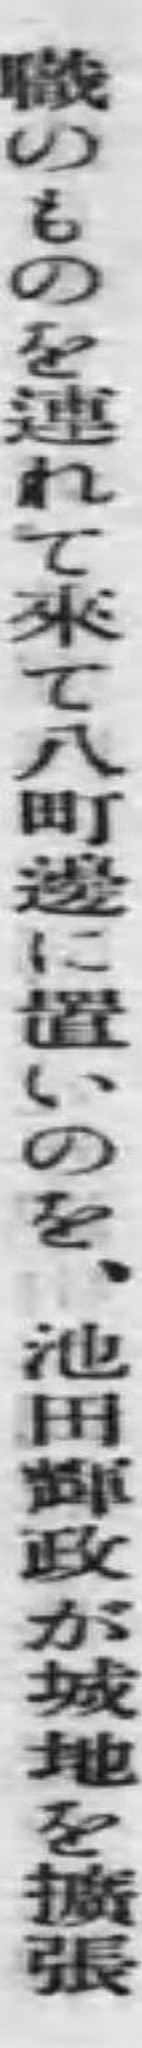職のものを連れて来て八町辺に置いのを、池田輝政が城地を拡張
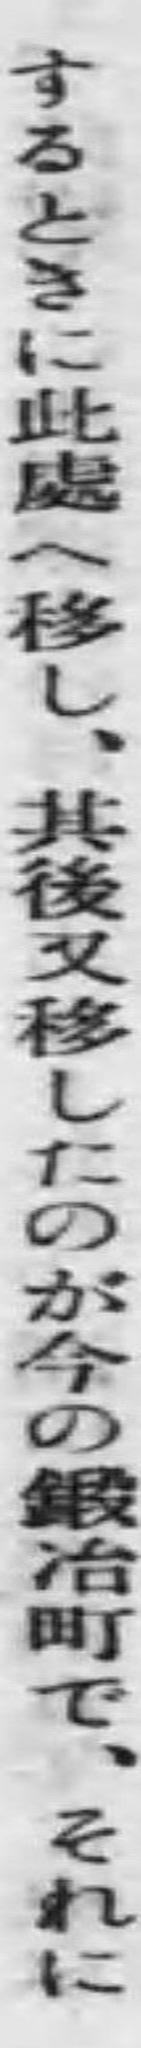するときに此処へ移し、其後又移したのが今の鍛冶町で、それに
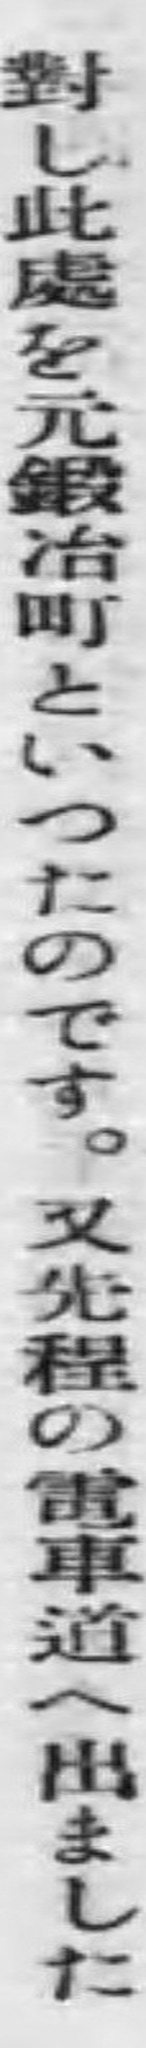対し此処を元鍛冶町といつたのです。又先程の電車道へ出ました
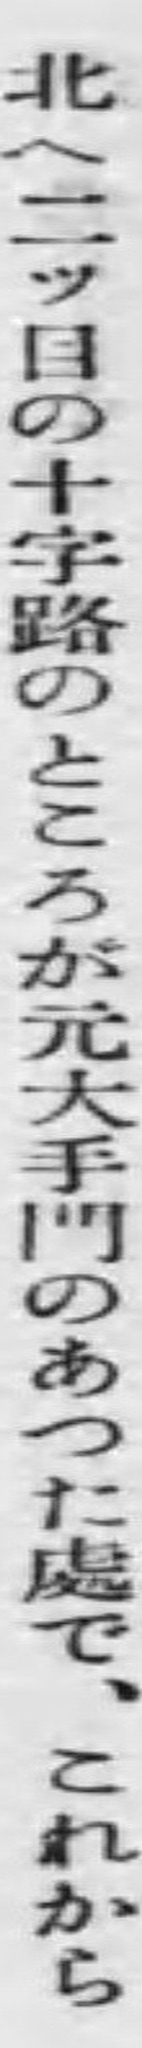北へ二ッ目の十字路のところが元大手門のあつた処で、これから
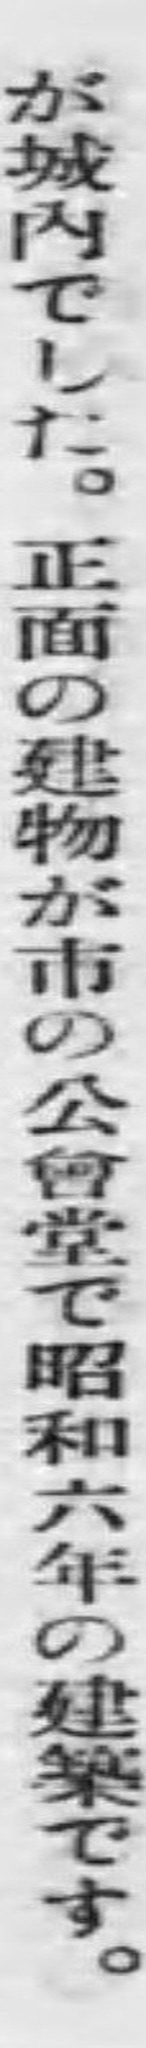が城内でした。正面の建物が市の公会堂で昭和六年の建築です。
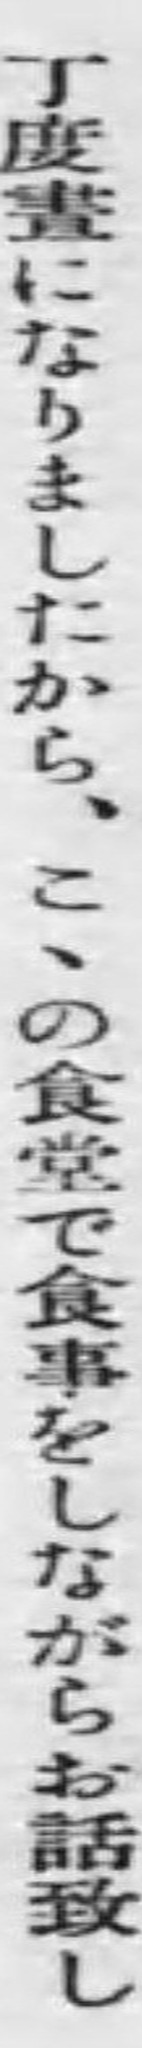丁度昼になりましたから、こゝの食堂で食事をしながらお話致し
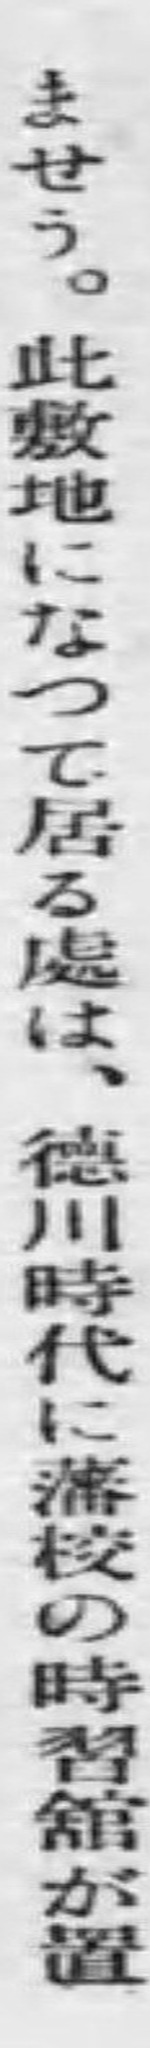ませう。此敷地になつて居る処は、徳川時代に藩校の時習館が置
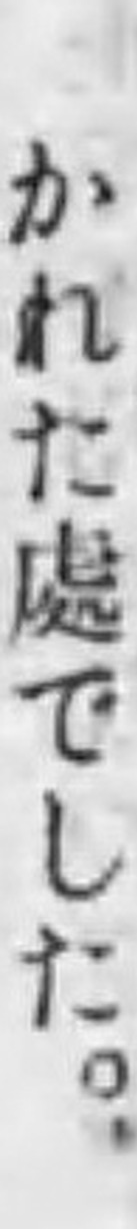かれた処でした。
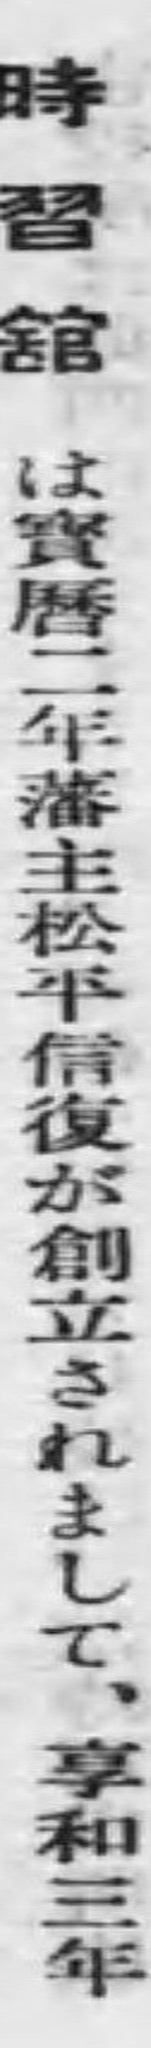時習館は宝暦二年藩主松平信復が創立されまして、享和三年
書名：東三河道中記 : 豊橋市及其附近案内
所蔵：国立国会図書館 National Diet Library, JAPAN
